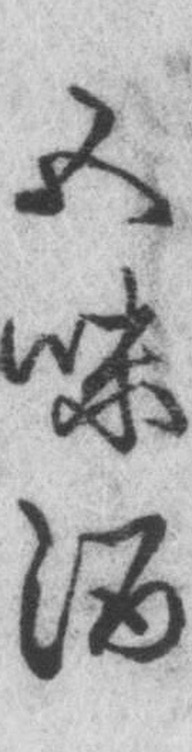五味酒
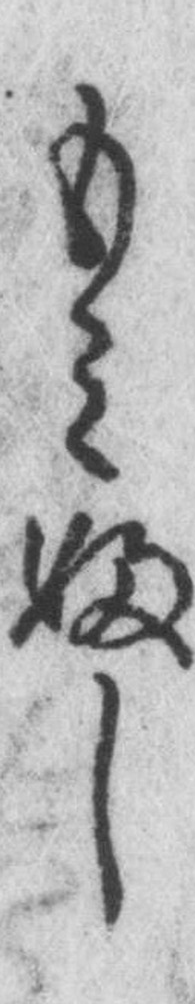もみ婦し

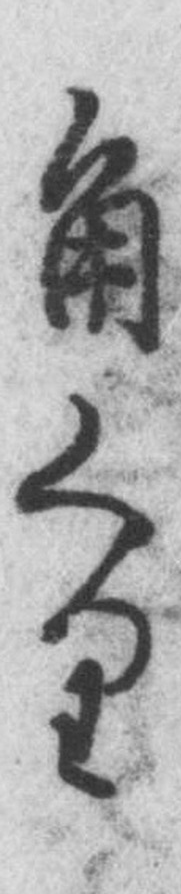角く里

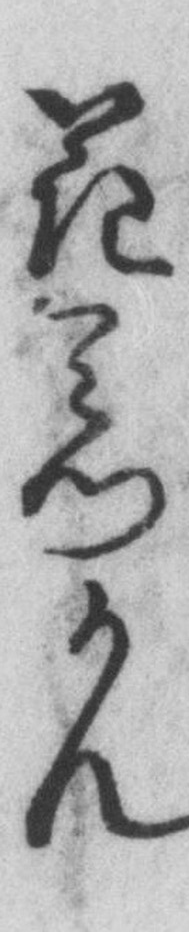花みつかん
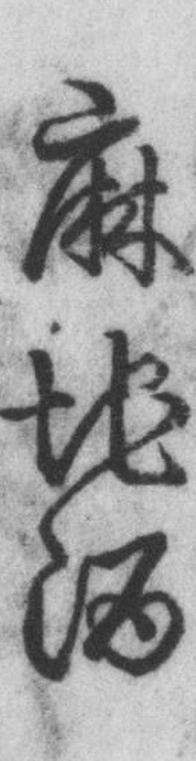麻地酒
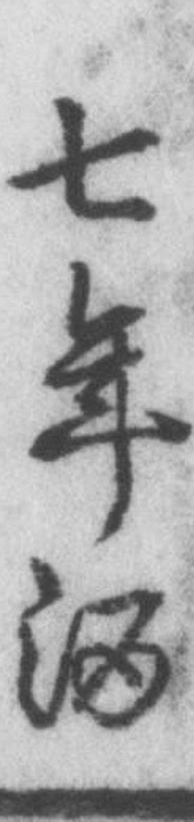七年酒
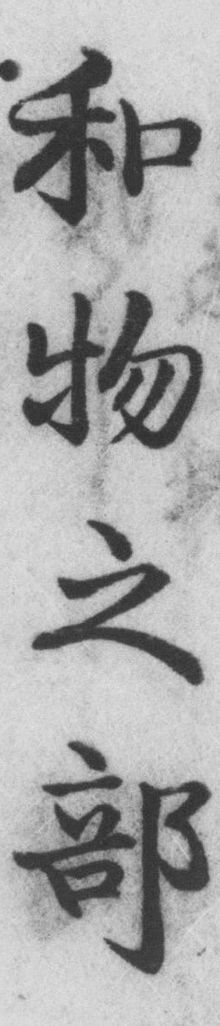和物之部

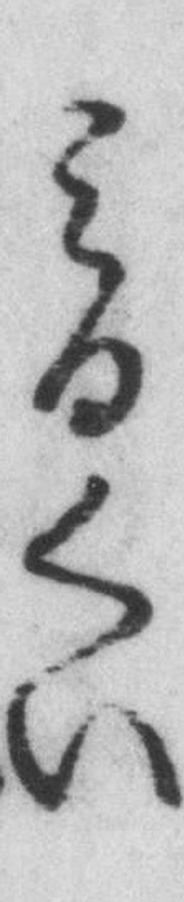みるくい
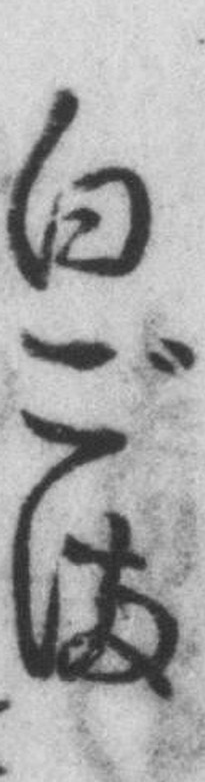白ご満
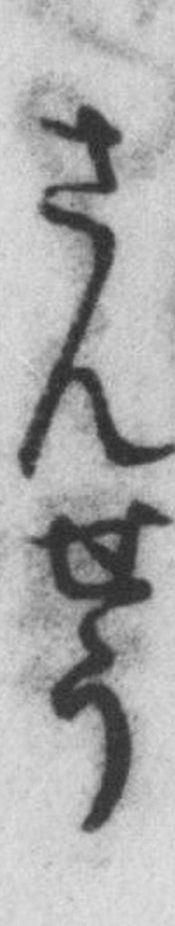さんせう

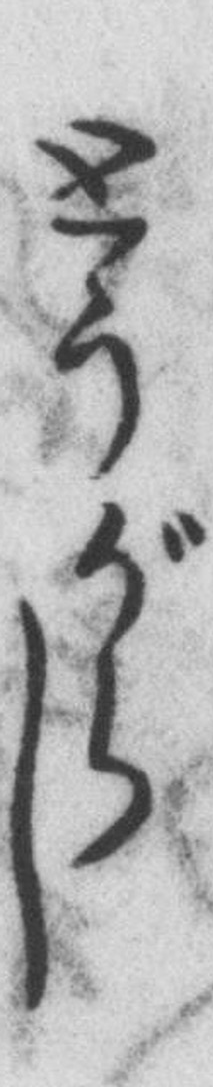とうがらし
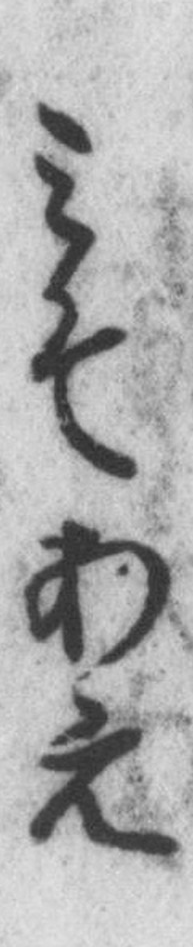みそあへ
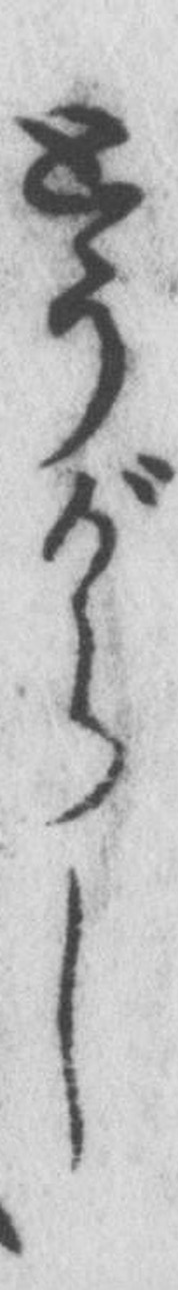とうがらし
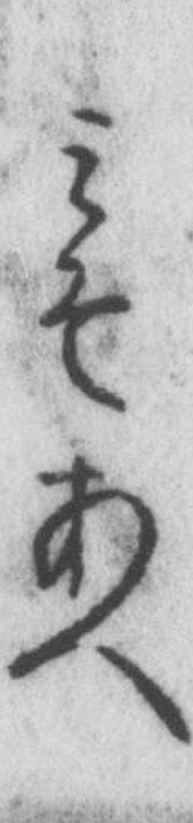みそあへ
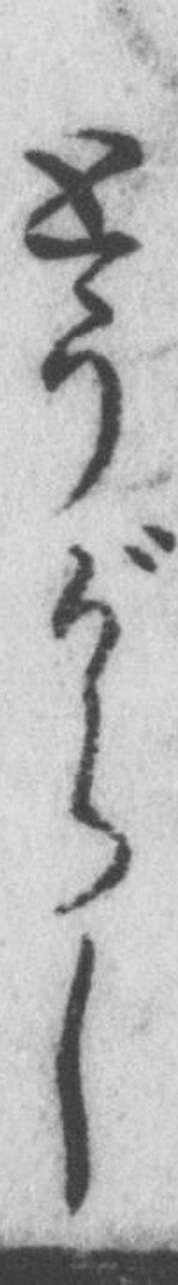とうがらし
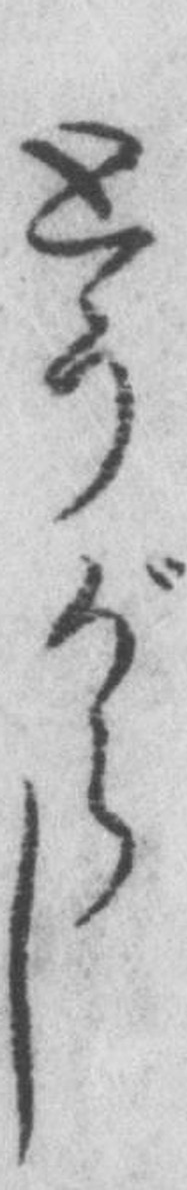とうがらし
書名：料理伊呂波庖丁
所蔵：大阪府立大学学術情報センター 国文学研究資料館
